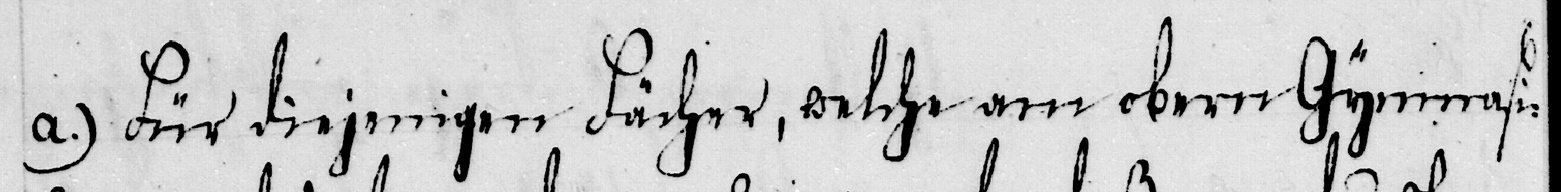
a.) Für diejenigen Fächer, welche am obern Gymnasi¬
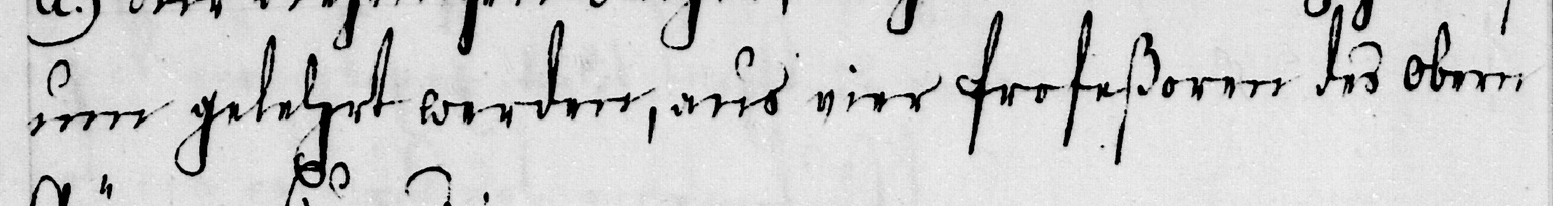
um gelehrt werden, aus vier Profeßoren des obern
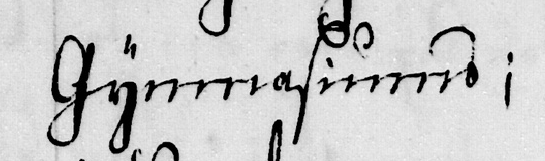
Gymnasiums;
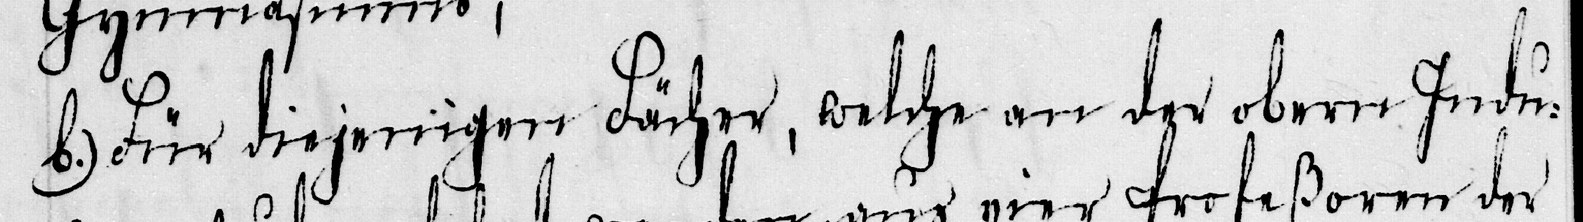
b.) Für diejenigen Fächer, welche an der obern Indu¬
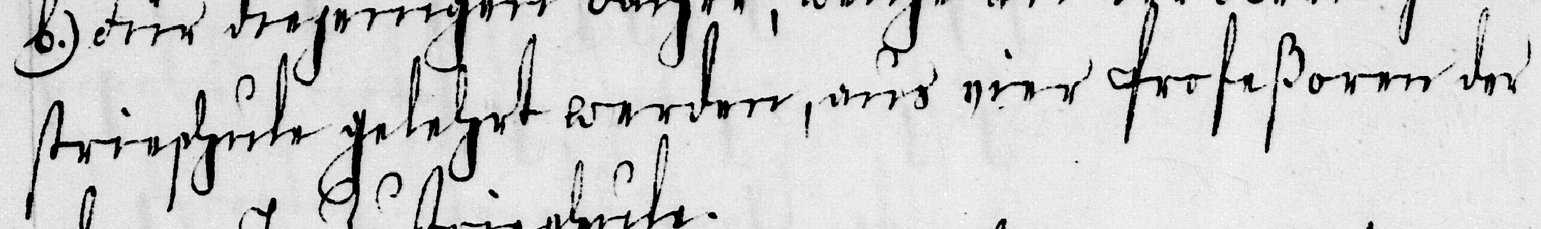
strieschule gelehrt werden, aus vier Profeßoren der
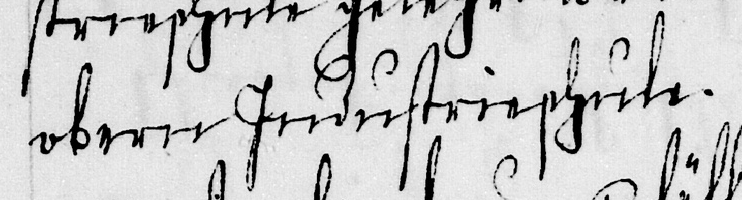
obern Industrieschule.
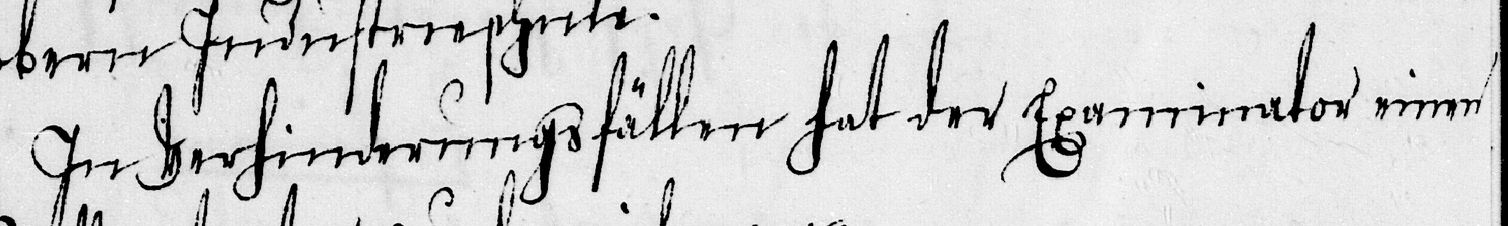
In Verhinderungsfällen hat der Examinator einen
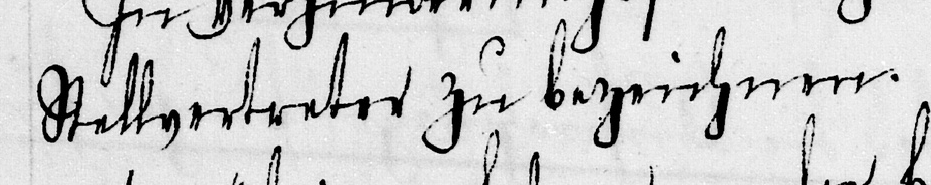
Stellvertreter zu bezeichnen.
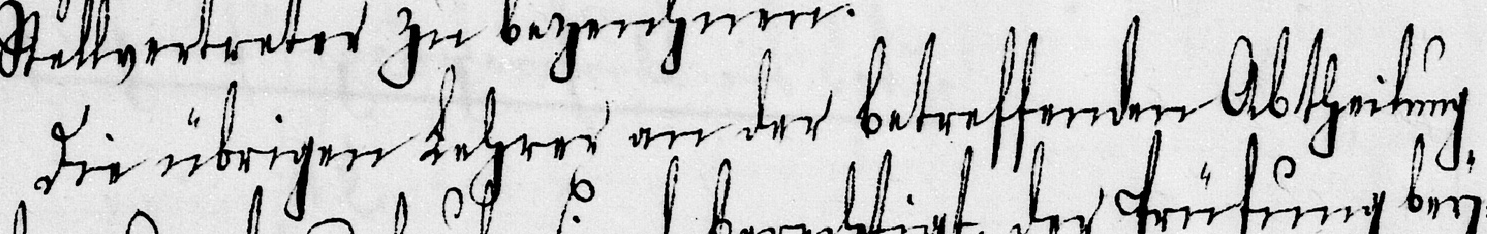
Die übrigen Lehrer an der betreffenden Abtheilung
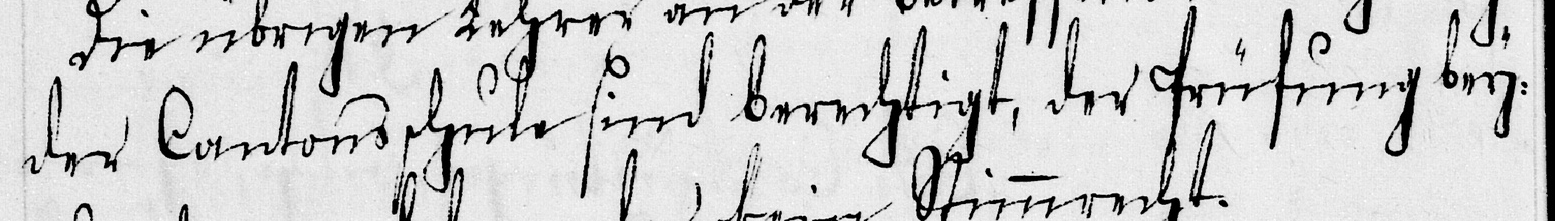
der Cantonsschule sind berechtigt, der Prüfung bey¬
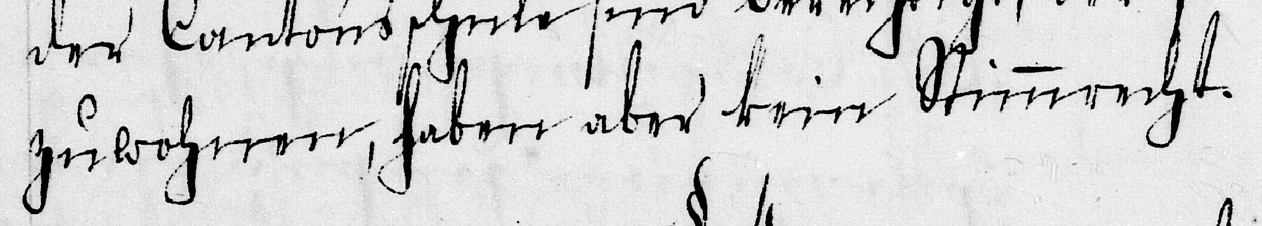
zuwohnen, haben aber kein Stimmrecht.
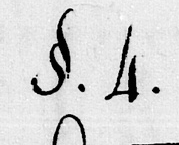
§. 4.
